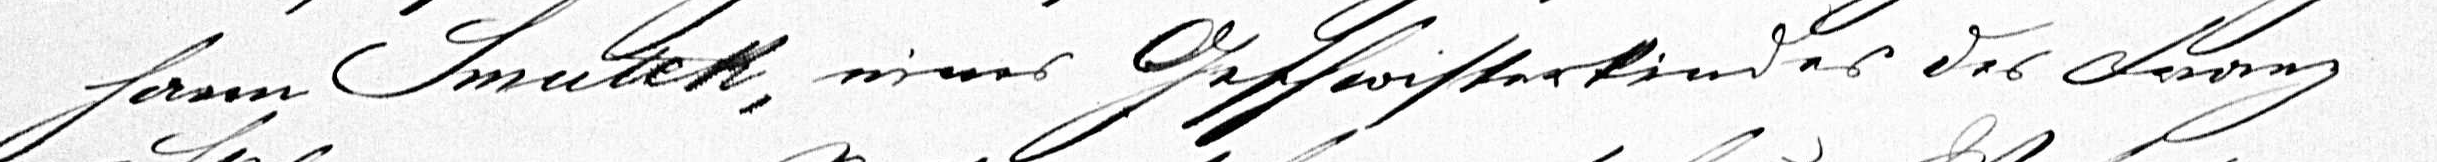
hann Smutek, eines Geschwisterkindes des Franz
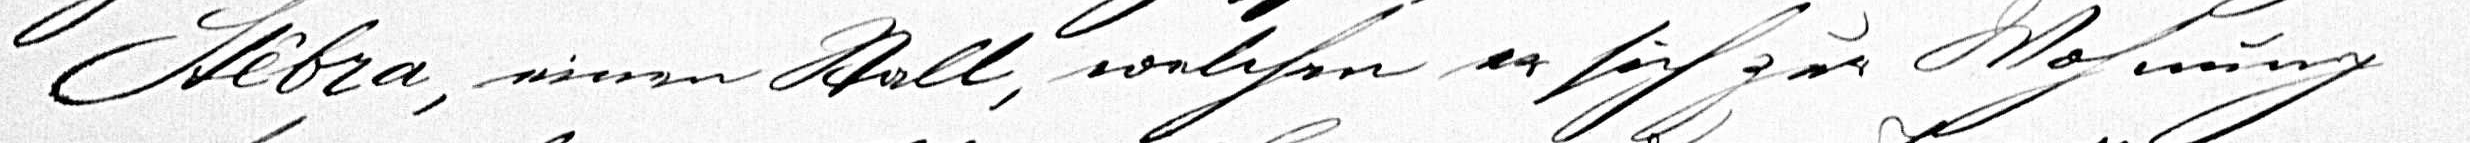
Stebra, einen Stall, welchen er sich zur Wohnung
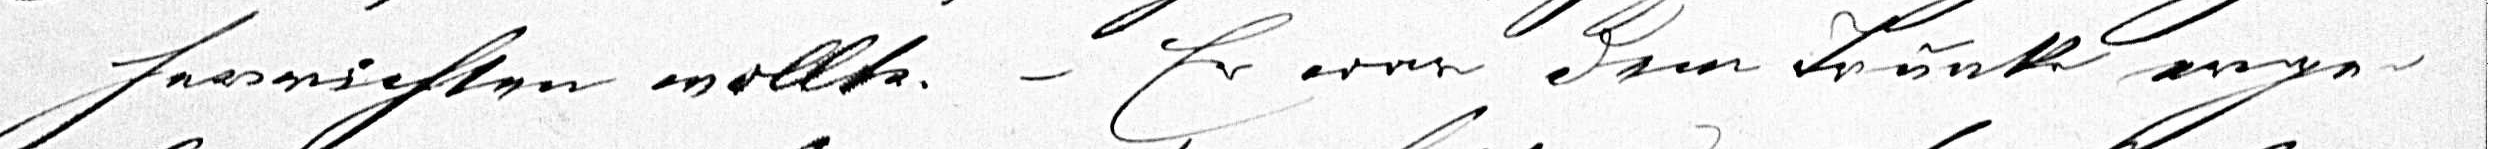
herrichten wollte. - Er war dem Trunk erge¬
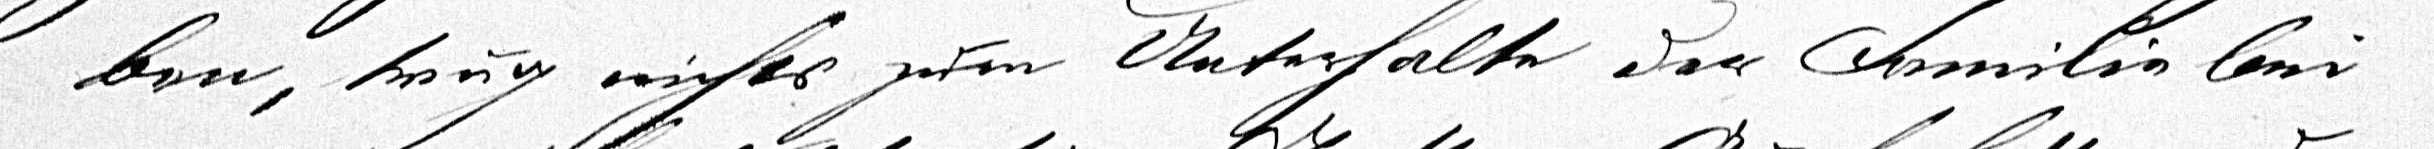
ben, trug nichts zum Unterhalte der Familie bei
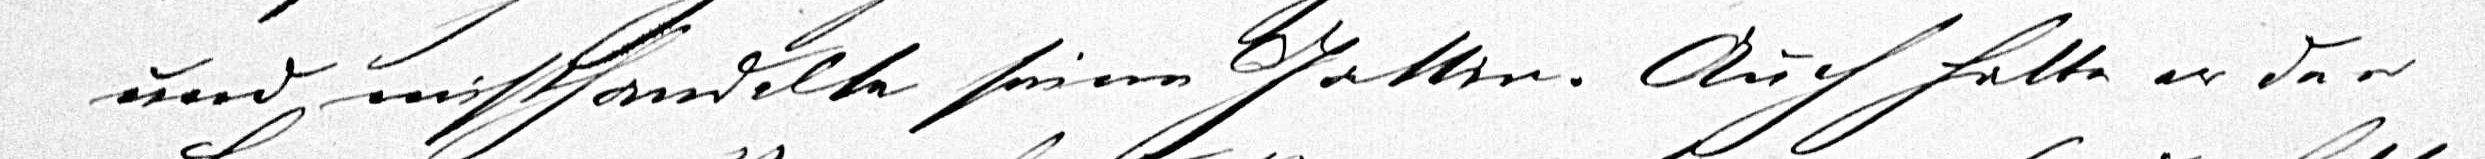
und mißhandelte seine Gattin. Auch hatte er den
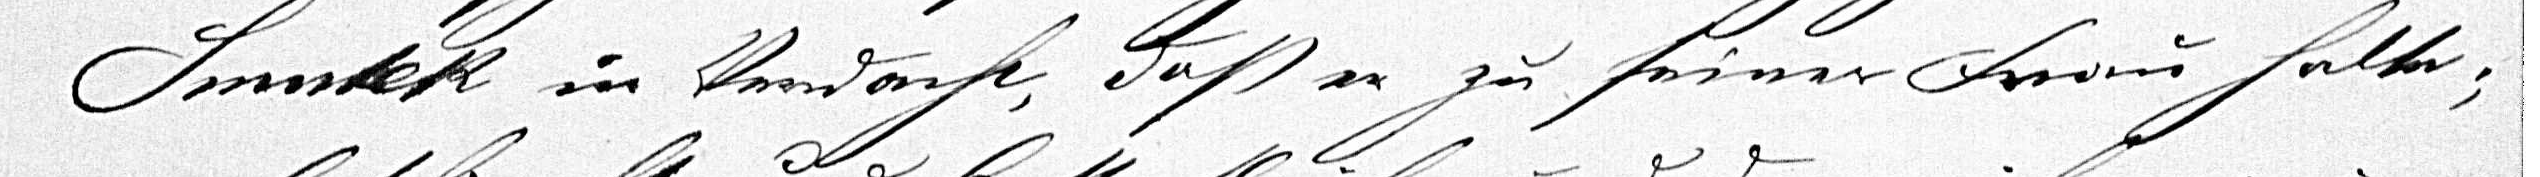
Smutek in Verdacht, daß er zu seiner Frau hatte;
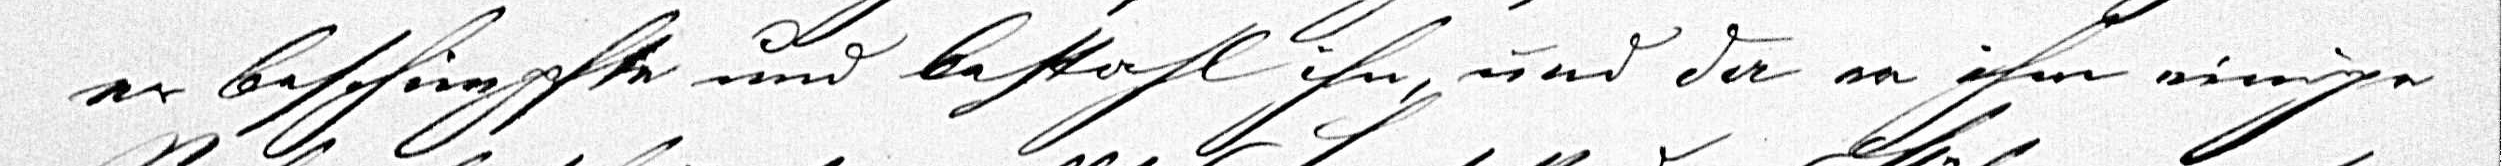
er beschimpfte und bestahl ihn, und da er ihm einige
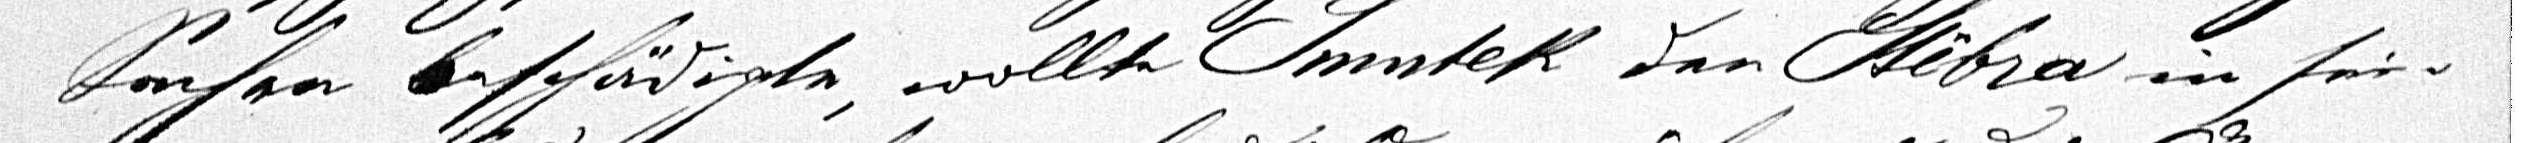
Sachen beschädigte, wollte Smutek den Stebra in sei¬
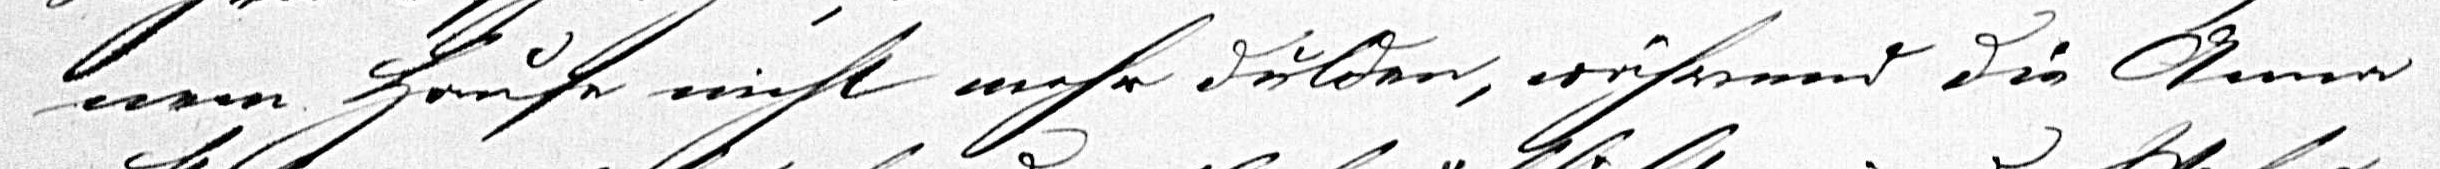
nem Hause nicht mehr dulden, während die Anna
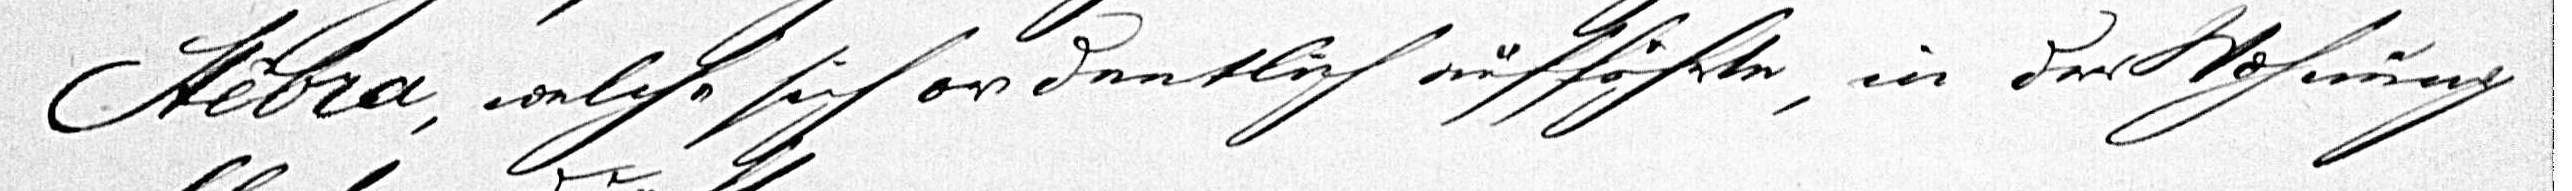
Stebra, welche sich ordentlich aufführte, in der Wohnung
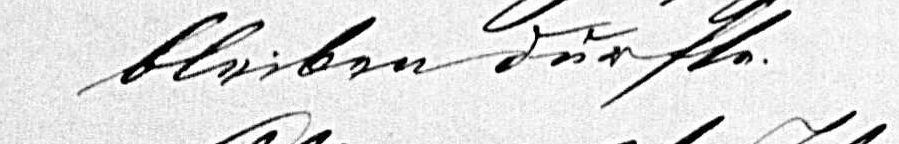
bleiben durfte.
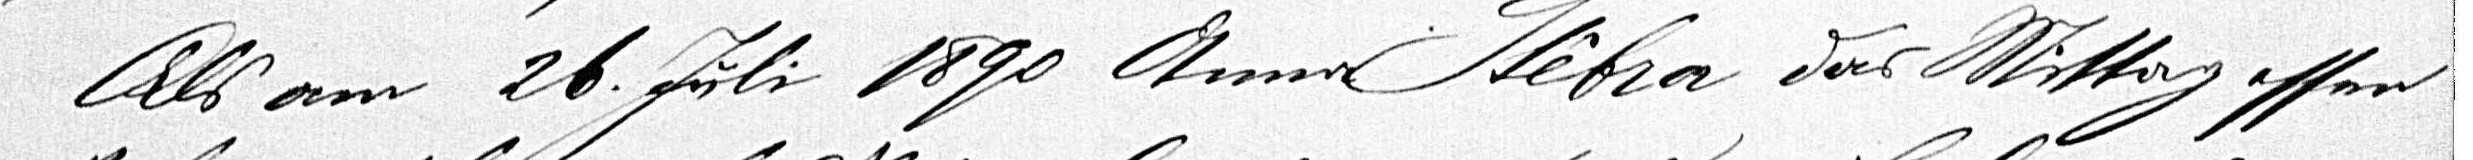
Als am 26. Juli 1890 Anna Stebra das Mittag essen
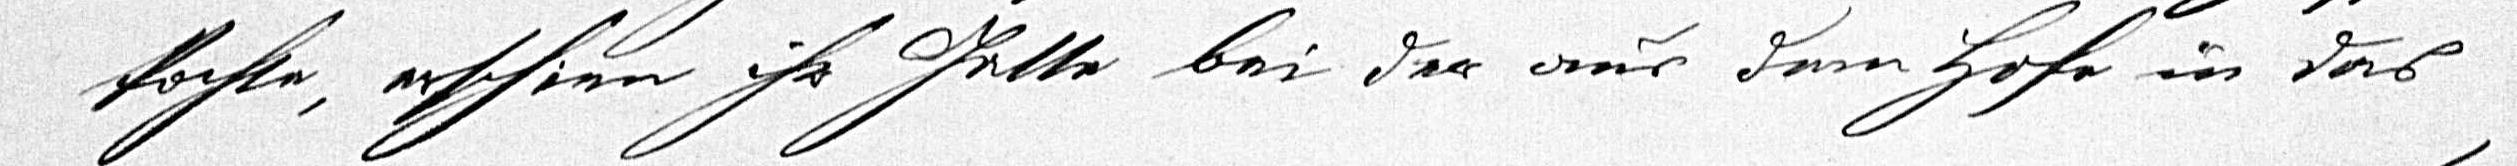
kochte, erschien ihr Gatte bei der aus dem Hofe in das
